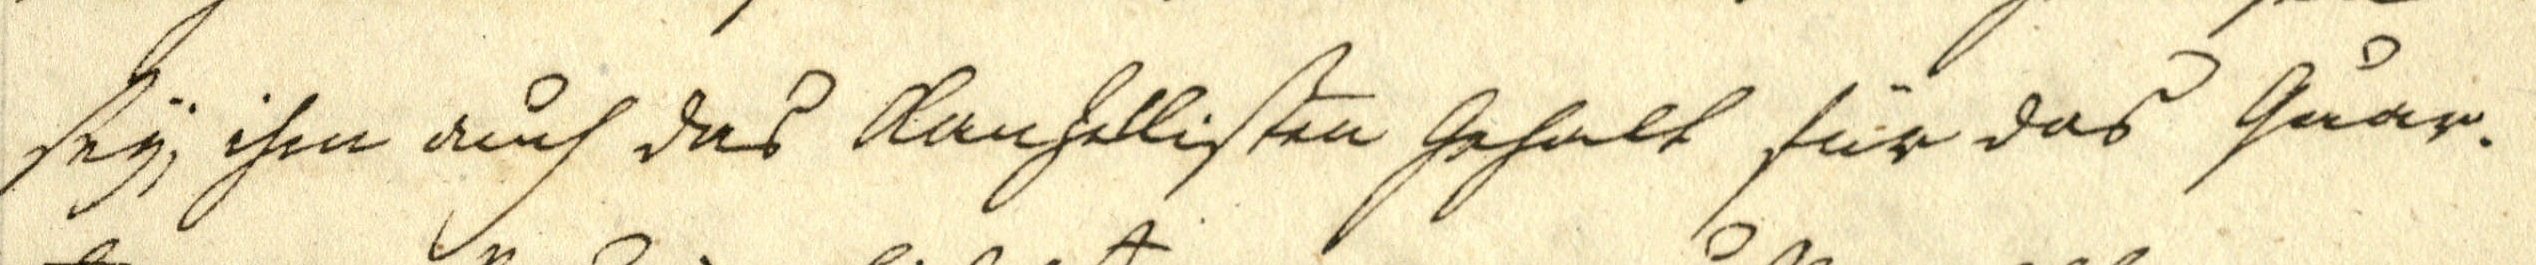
seÿ, ihm auch das Kanzellisten Gehalt für das Quar¬
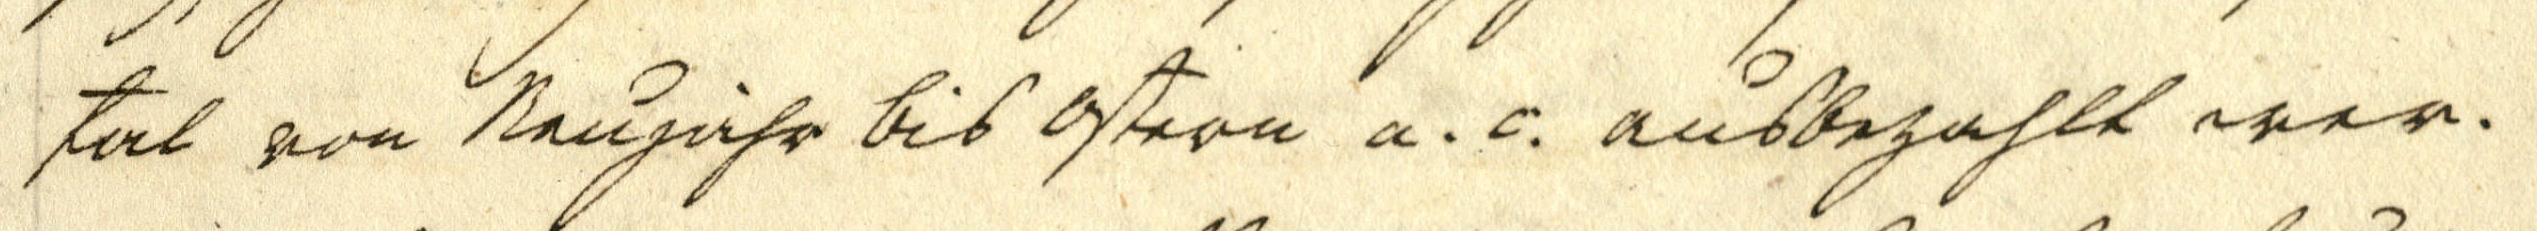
tal von Neujahr bis Ostern a. c. ausbezahlt wer¬
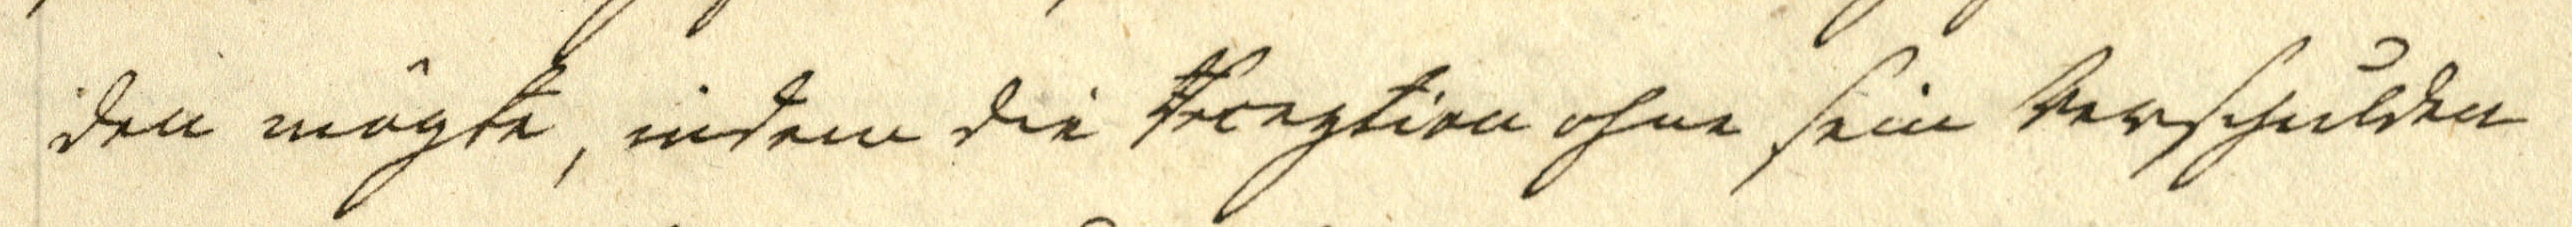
den mögte, indem die Reception ohne sein Verschulden
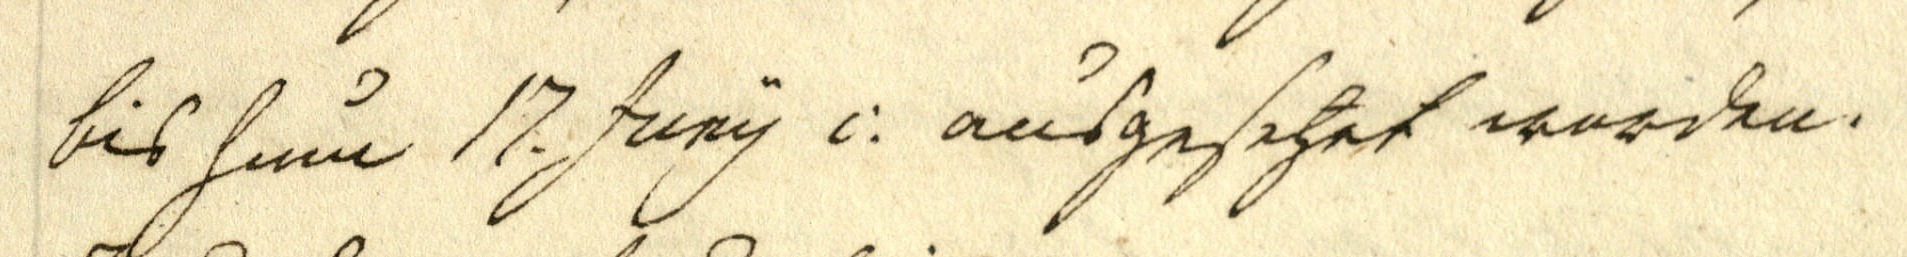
bis zum 17. Junÿ c. ausgesetzet worden.
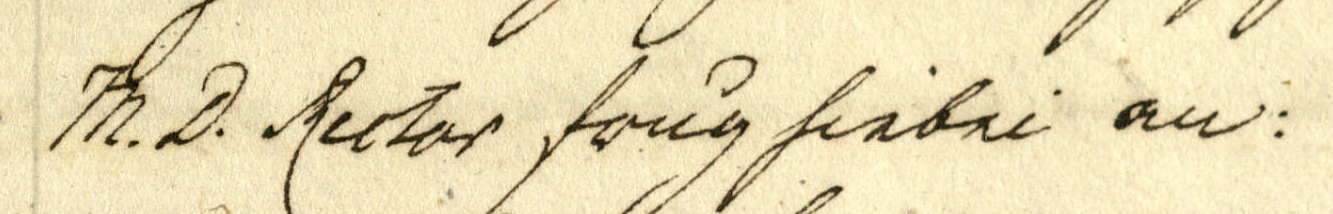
M. D. Rector frug hiebei an:
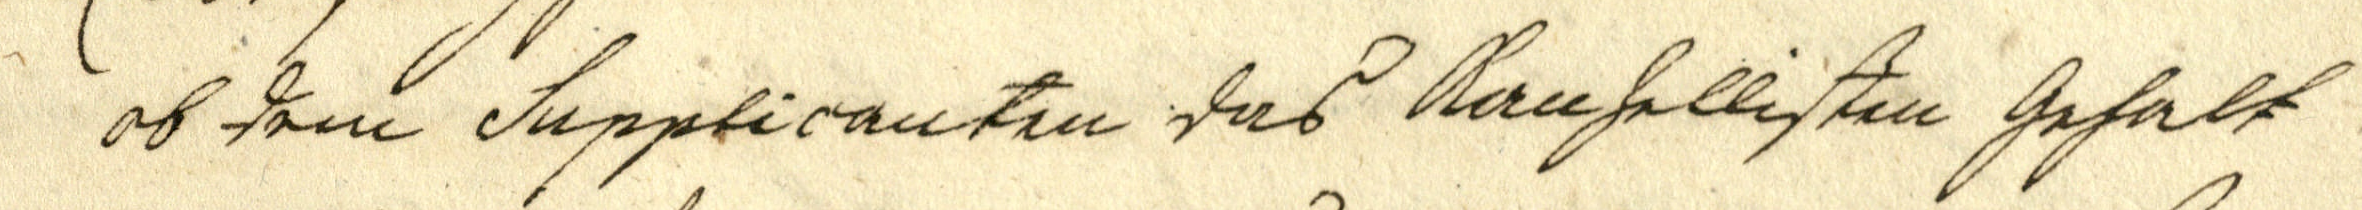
ob dem Supplicanten das Kanzellisten Gehalt
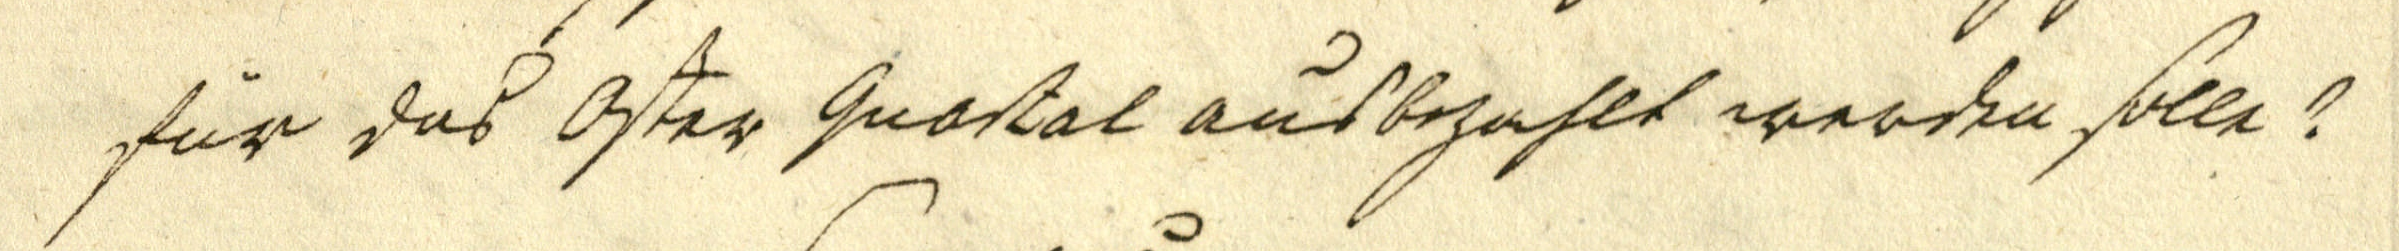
für das Oster Quartal ausbezahlt werden solle?
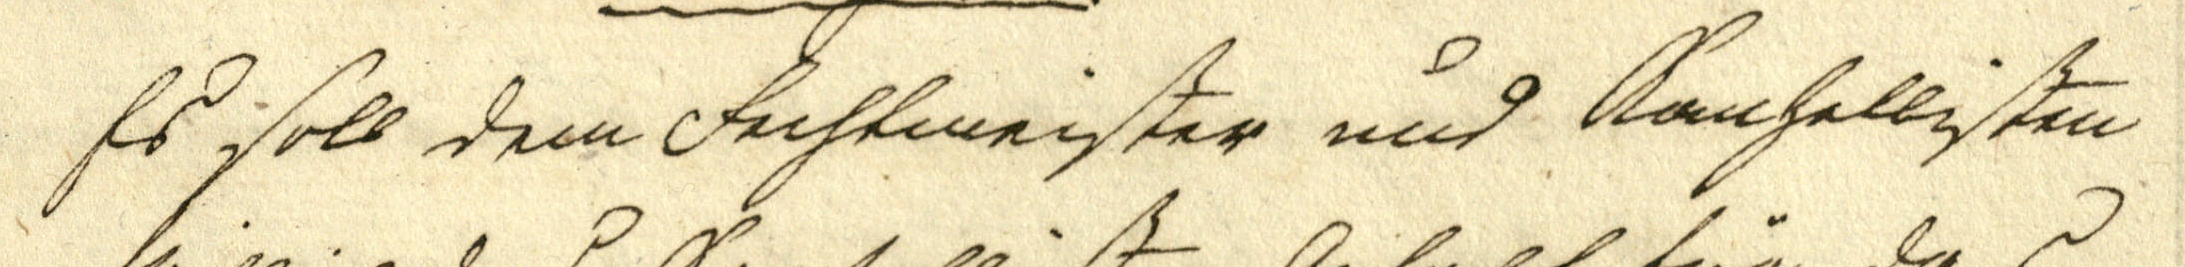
Es soll dem Fechtmeister und Kanzellisten
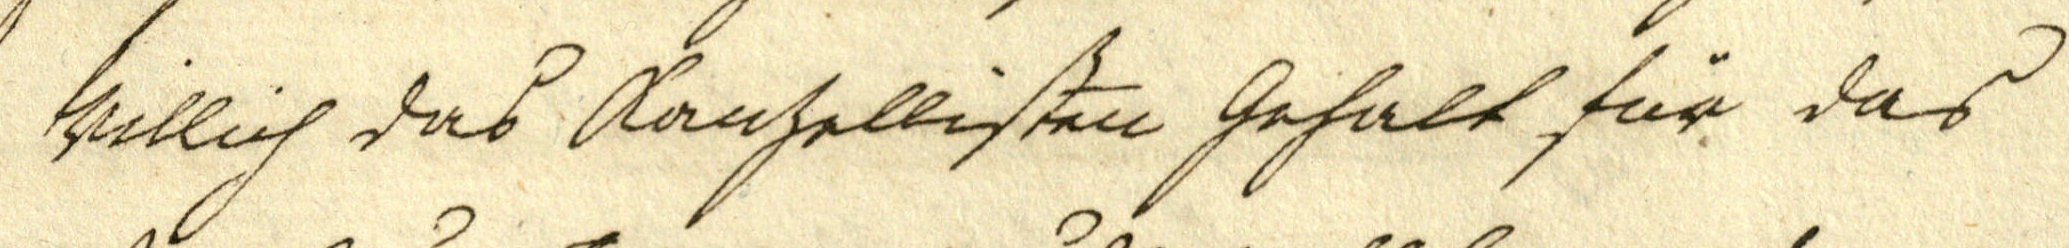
Willich das Kanzellisten Gehalt für das
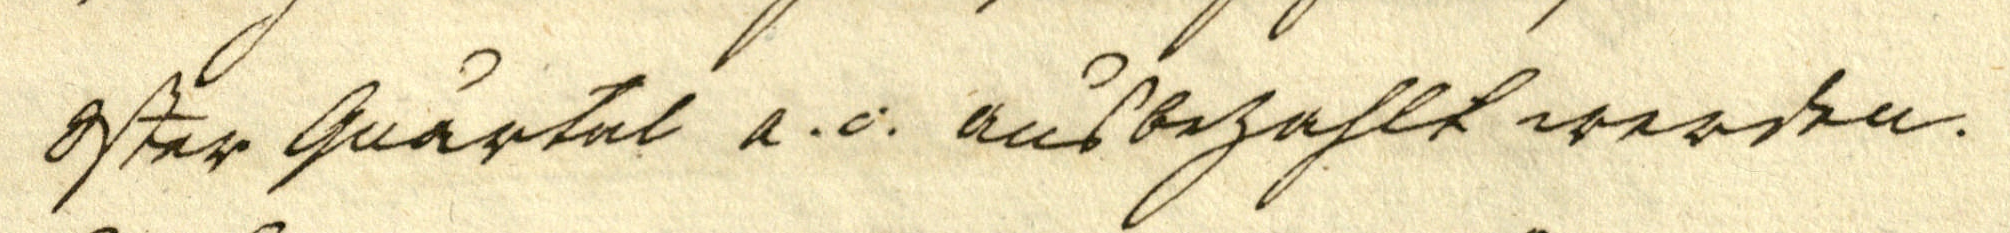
Oster Quartal a. c. ausgbezahlt werden.
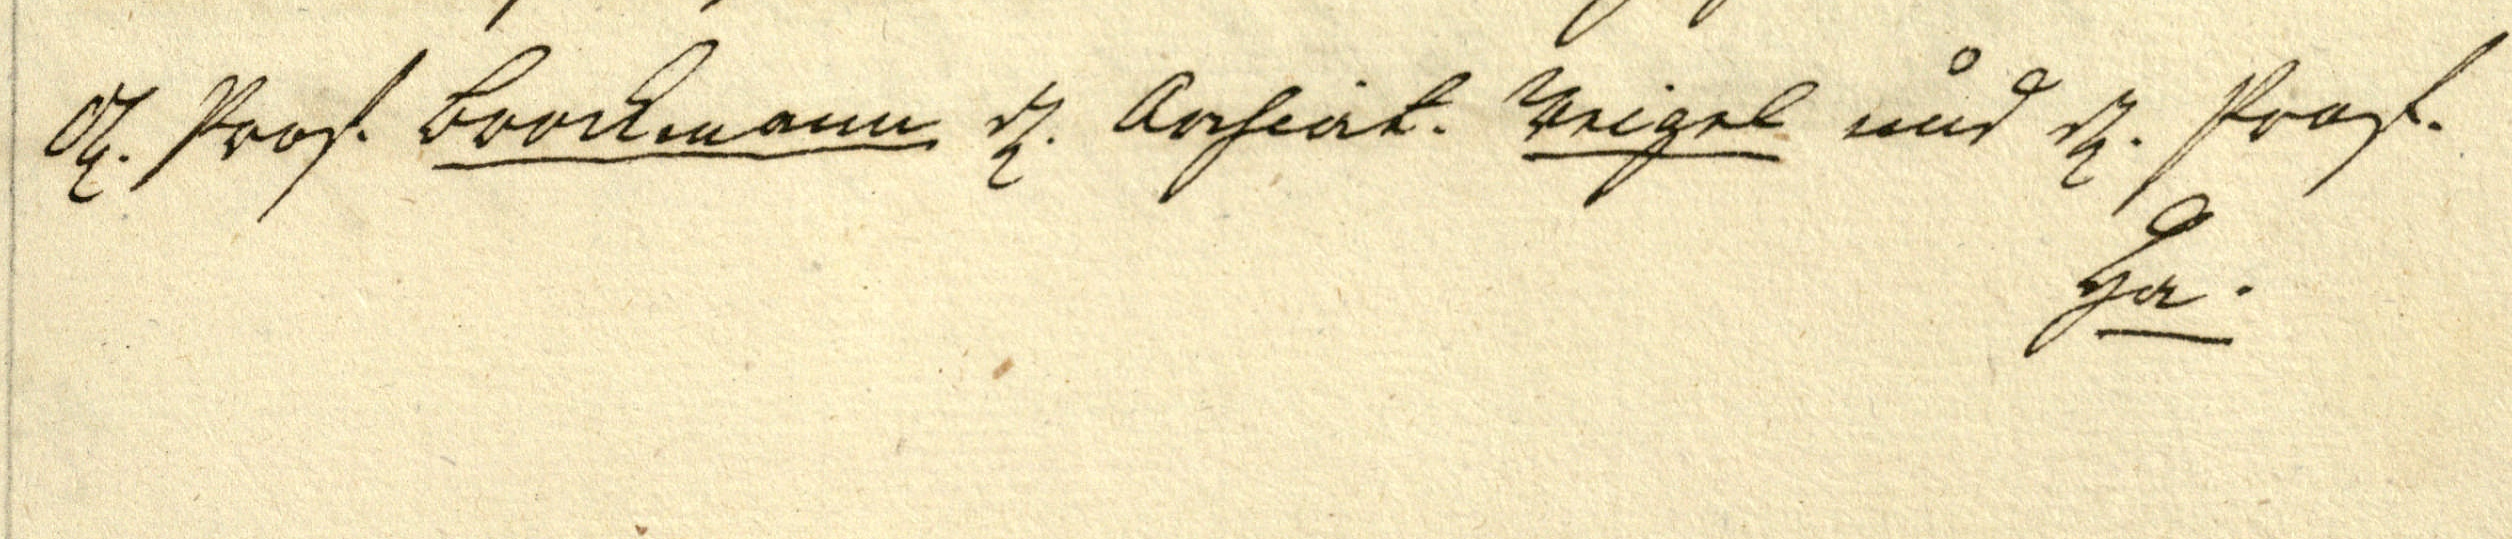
dh. Prof. Brockmann dh. Archiat. Weigel und dh. Prof.
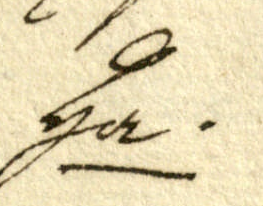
Ha.
